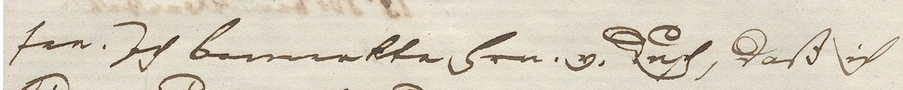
sen. Ich bemerkte Hrn. v. Dusch, daß ich
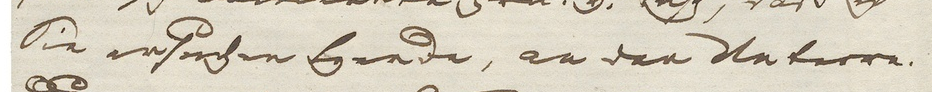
Sie ersuchen werde, an der Unterre-
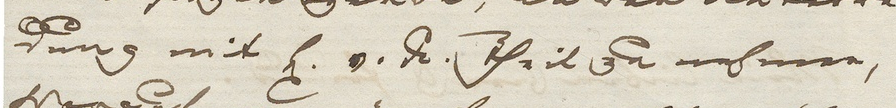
dung mit H. v. R. Theil zu nehmen,
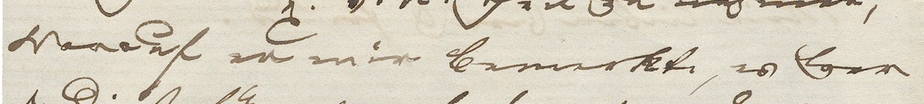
worauf er mir bemerkte, es wer-
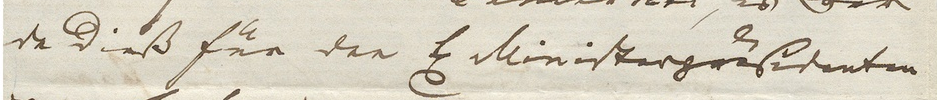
de dieß für den Herrn Ministerpräsidenten
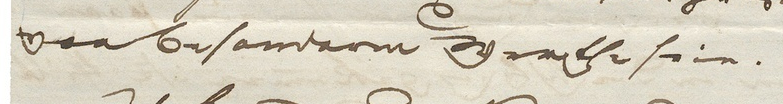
von besonderm Werthe sein.
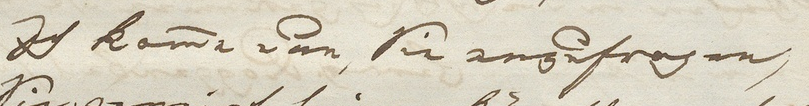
Ich komme nun, Sie anzufragen,
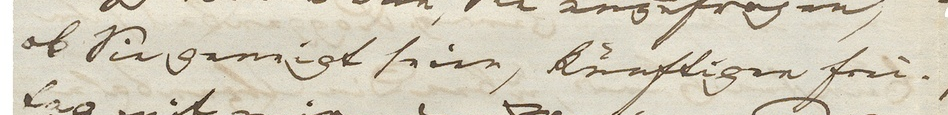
ob Sie geneigt seien, künftigen Frei-
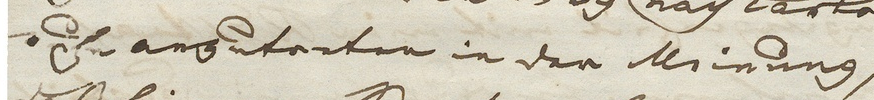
ruhe anzutreten in der Meinung,
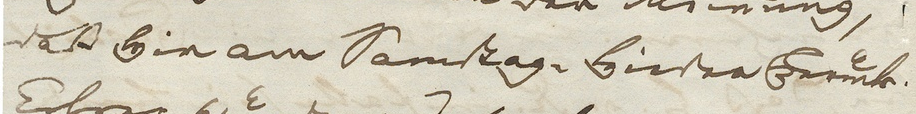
daß wir am Samstage wieder zurück-
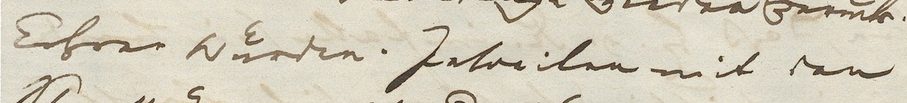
kehren würden. Jeweilen mit den
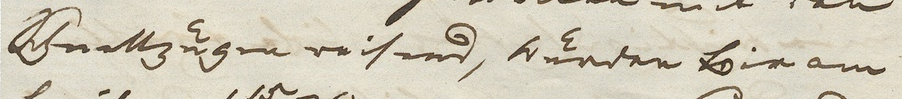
Schnellzügen reisend, würden wir am
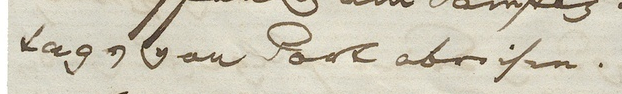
tags von dort abreisen.
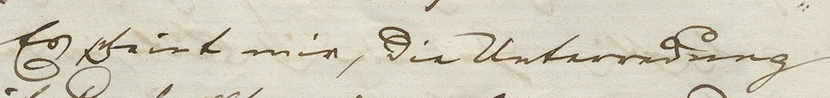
Es scheint mir, die Unterredung
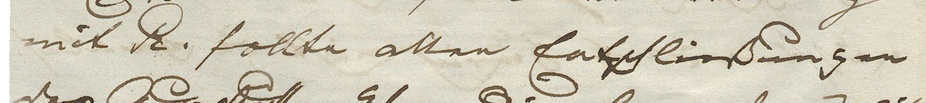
mit R. sollte allen Entschließungen
